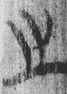之
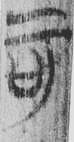可
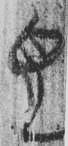見
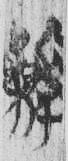操
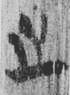之
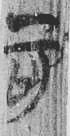可
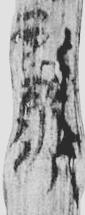○（握）
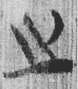之
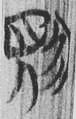則
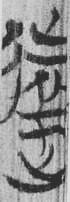○（失）
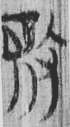敗
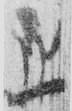之
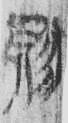則
